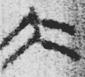大
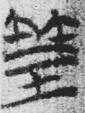○（畜）
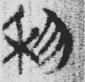利
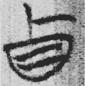貞
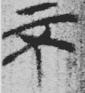不
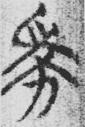○（家）
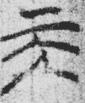而
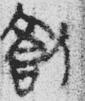飤（食）
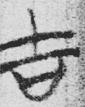吉
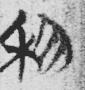利
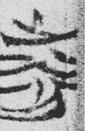涉
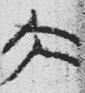大
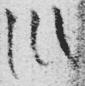川
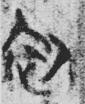初
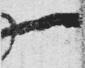九
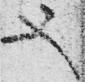又（有）
